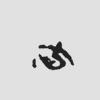冬
